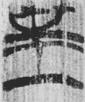皇
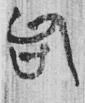句（后）
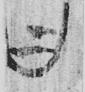曰
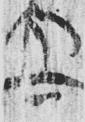立
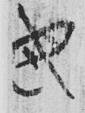母
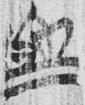爲
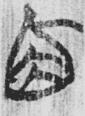角
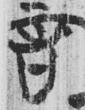言
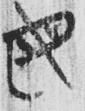母
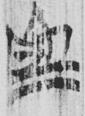爲
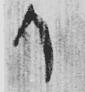人
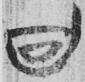昌（倡）
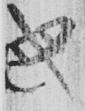母
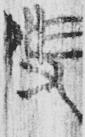拃（作）
